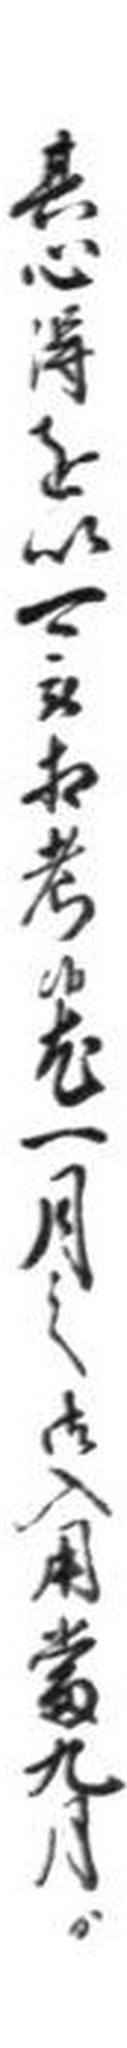其心得を以可被相考候尤一月之御入用当九月ゟ
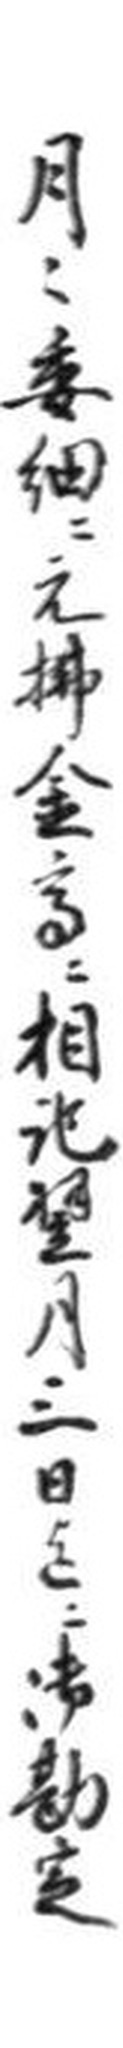月々委細ニ元払金高ニ相記翌月三日迄ニ御勘定
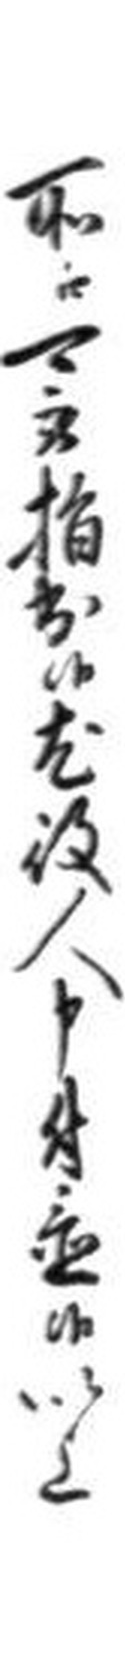所江可被指出候尤役人申付置候以上
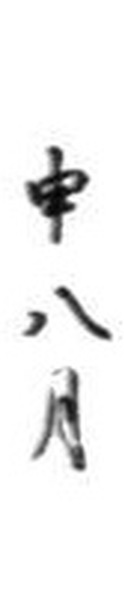申八月
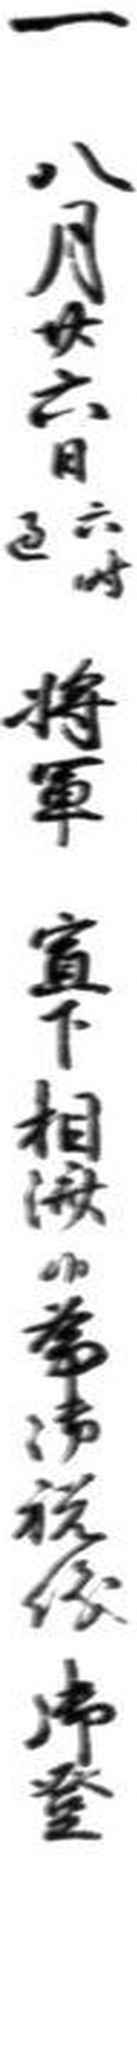一八月廿六日六時過将軍宣下相済候為御祝儀御登
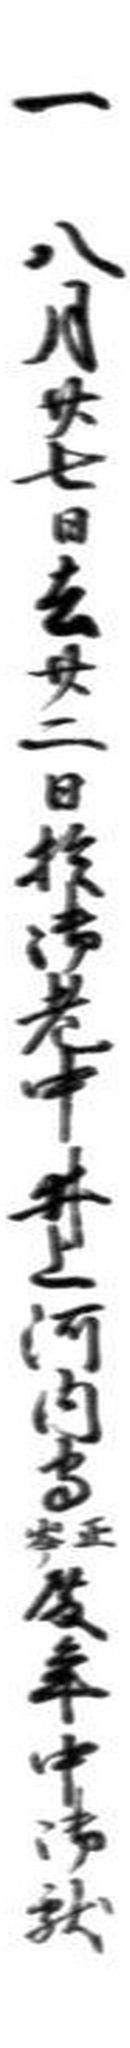一八月廿七日去廿二日於御老中井上河内守正岑殿年中御献
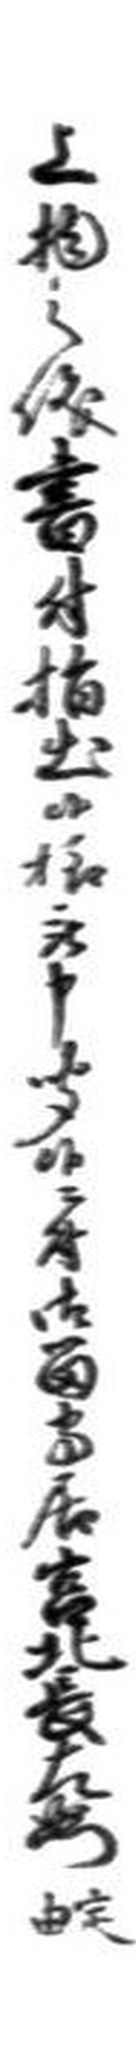上物之儀書付指出候様覚え被申聞候ニ付御留守居宮北長左衛門定由
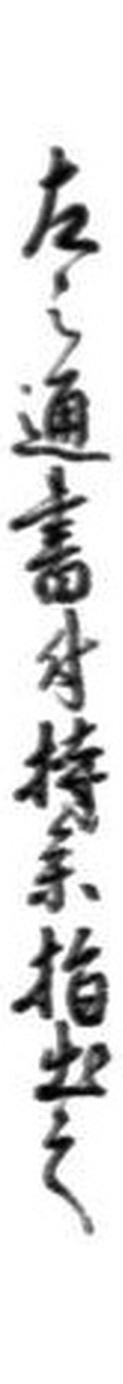左之通書付持参指出之
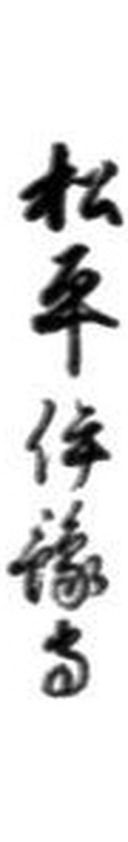松平伊予守

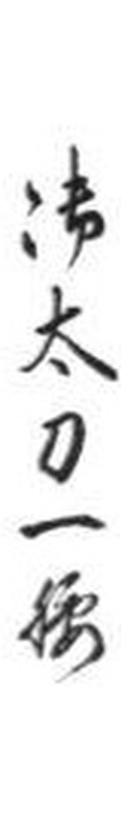御太刀一腰
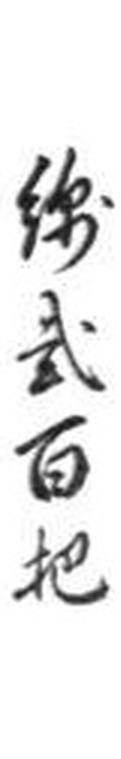綿弐百把
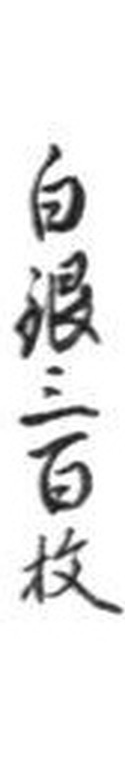白銀三百枚
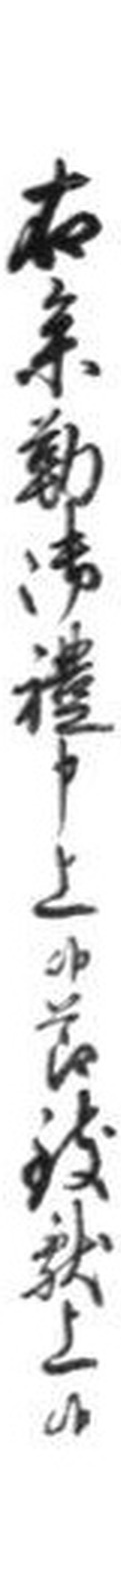右参勤御礼申上候節致献上候
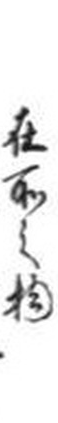在所之物
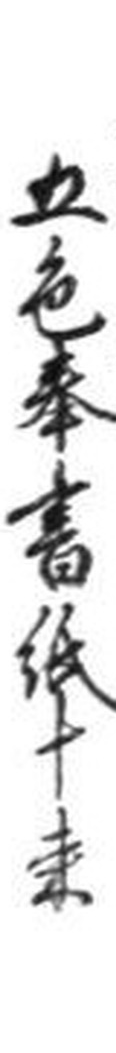五色奉書紙十束
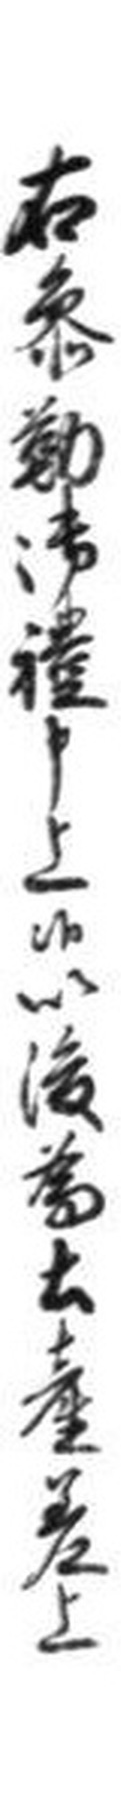右参勤御礼申上候以後為土産差上
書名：家譜 三十一 吉邦公 享保元年
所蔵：福井県文書館 Fukui Prefectural Archives
